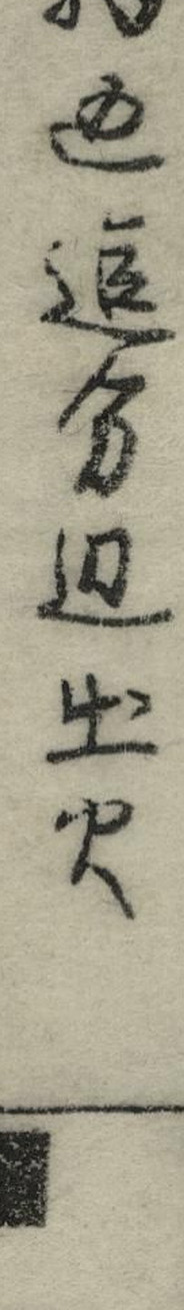駒込追分辺出火
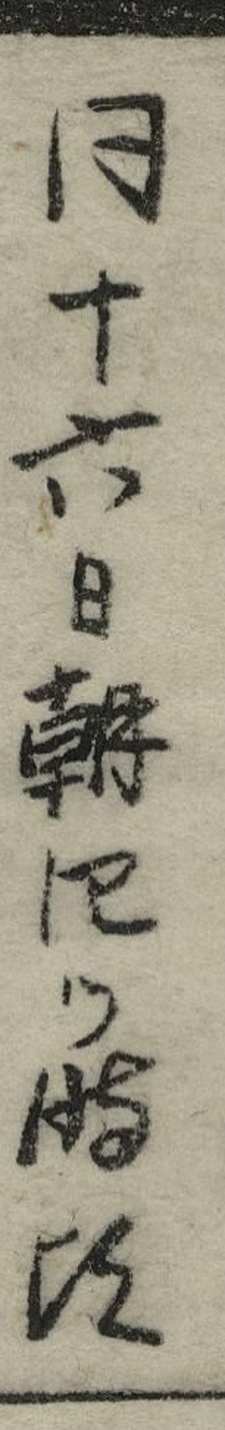同十六日朝四ッ時頃
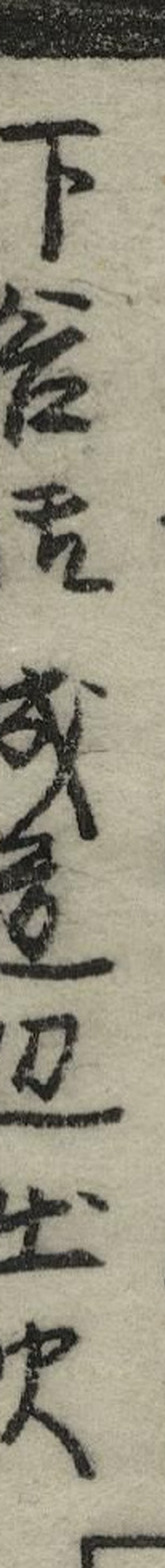下谷御成道辺出火
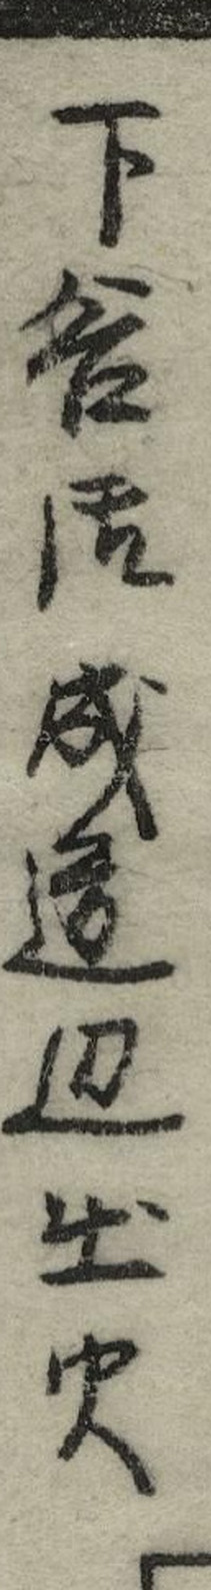下谷御成道辺出火
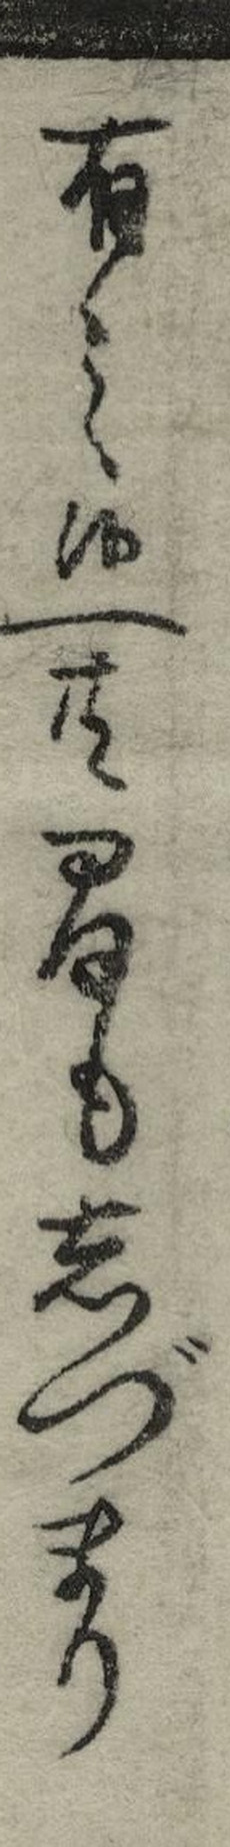有之候へ共間もしづまり
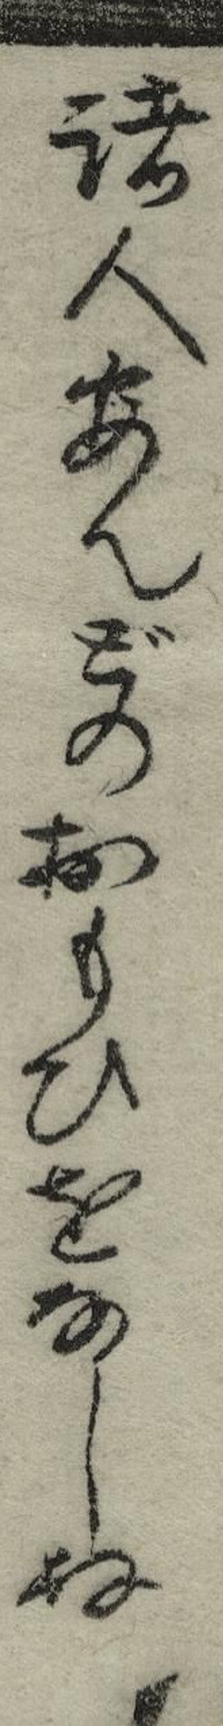諸人あんどのおもひをなしぬ
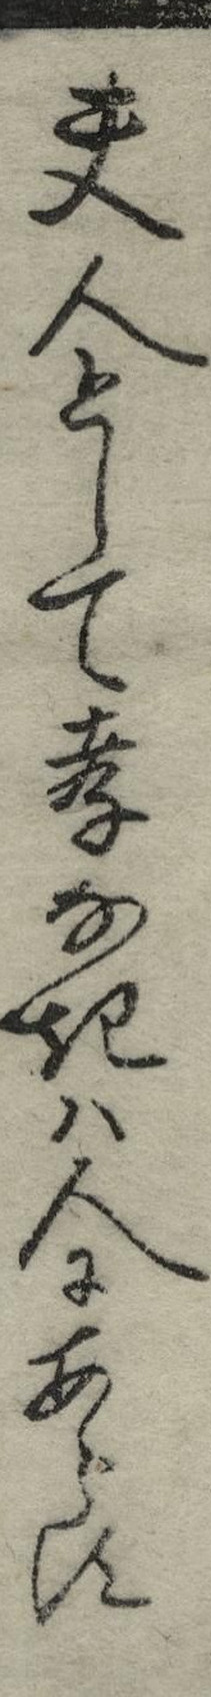夫人として孝なきは人にあらす
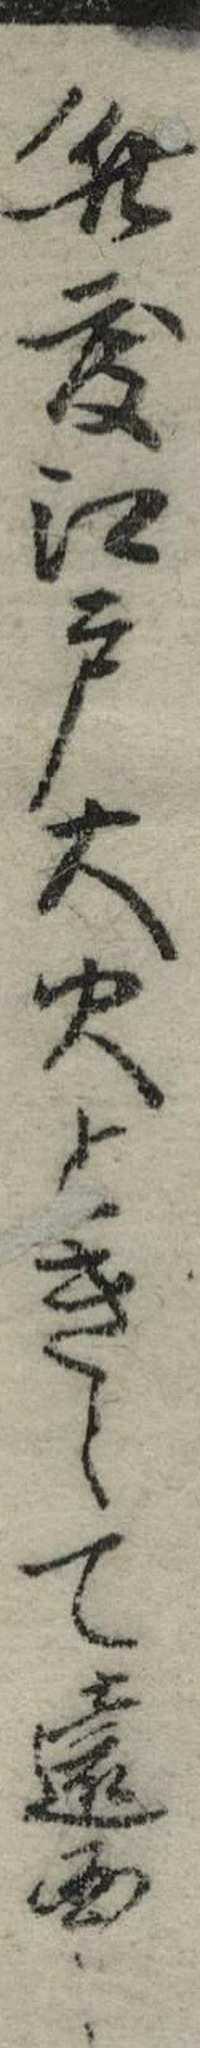此度江戸大火ときゝて遠国
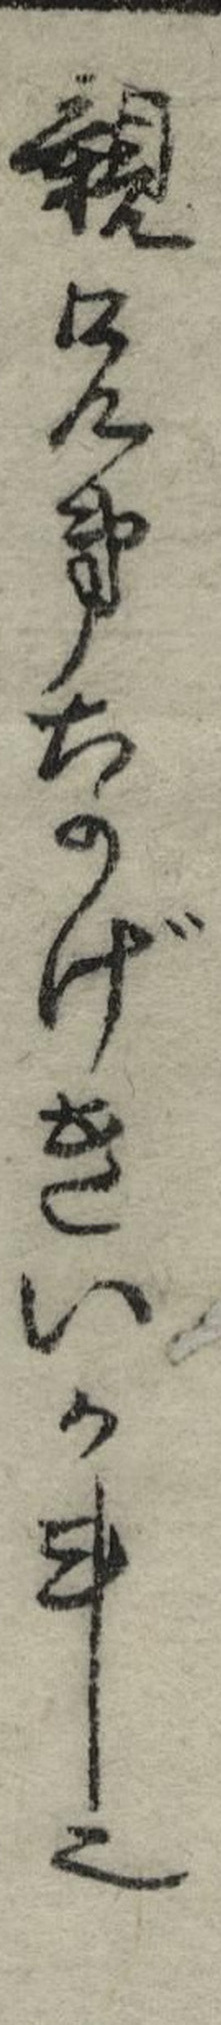親兄弟なげきいか斗也
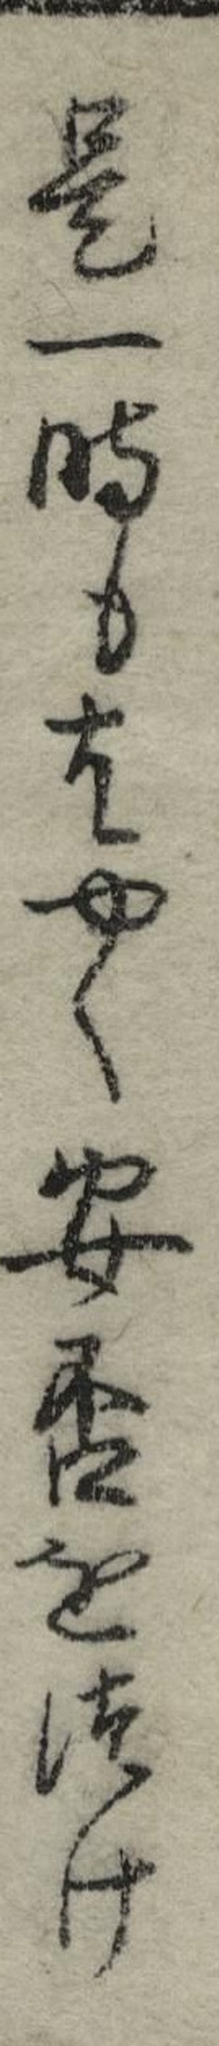是一時もはやく安否をつけ
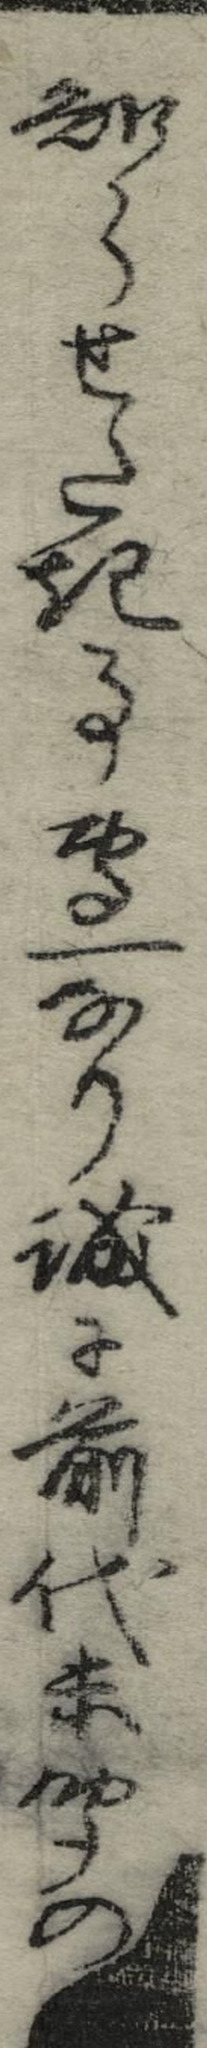知らせたき事専一なり誠に前代未聞の
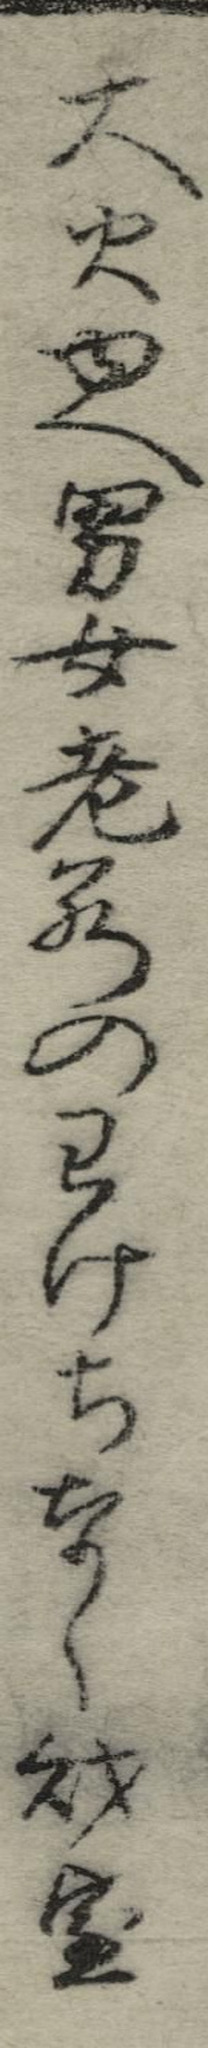大火ゆへ男女老若わけちなく財宝
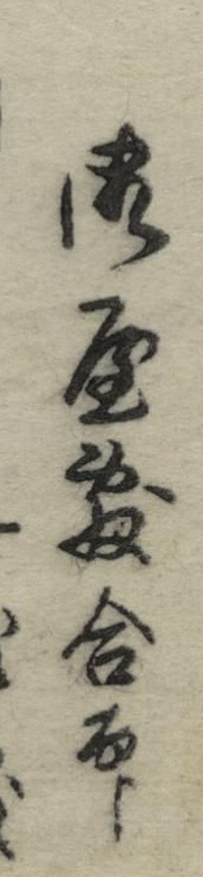御屋敷合印
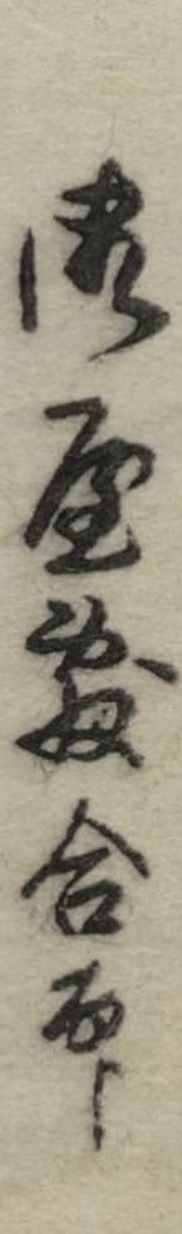御屋敷合印
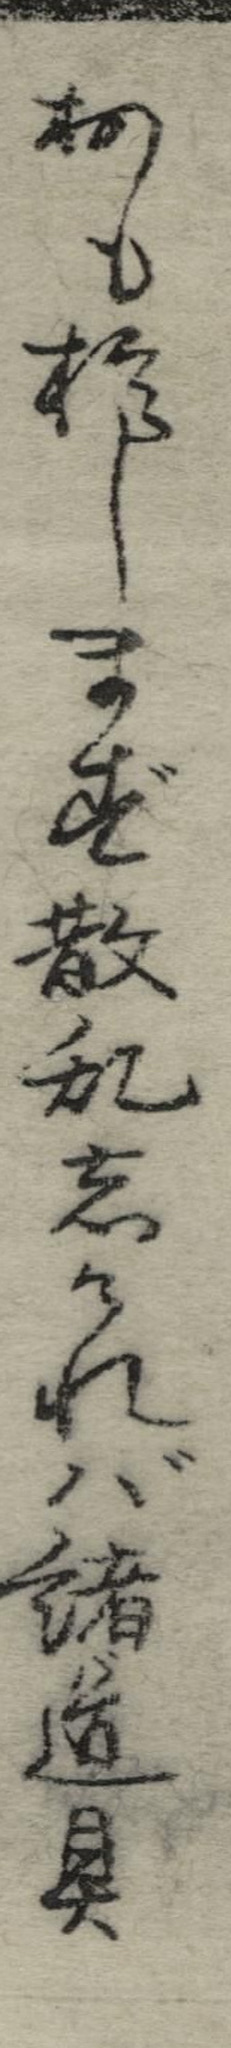おも惜しまず散乱しければ諸道具
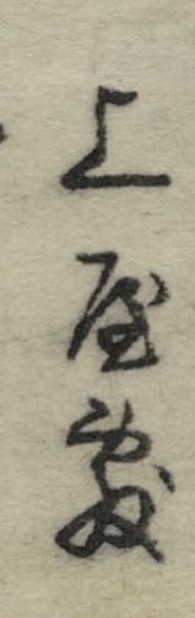上屋敷
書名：[天保五年二月の江戸大火に関する瓦版]
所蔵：東京大学地震研究所図書室 Earthquake Research Institute Library, The University of Tokyo, JAPAN
